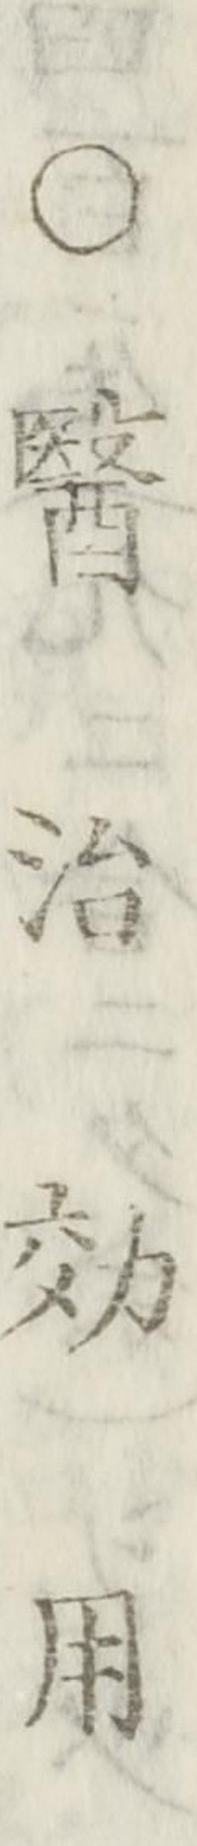〇医治効用
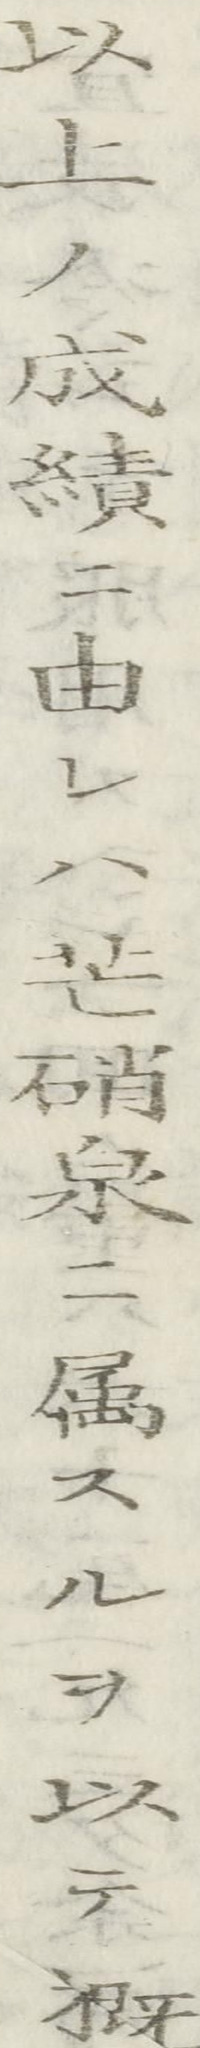以上ノ成績ニ由レハ芒硝泉ニ属スルヲ以テ概
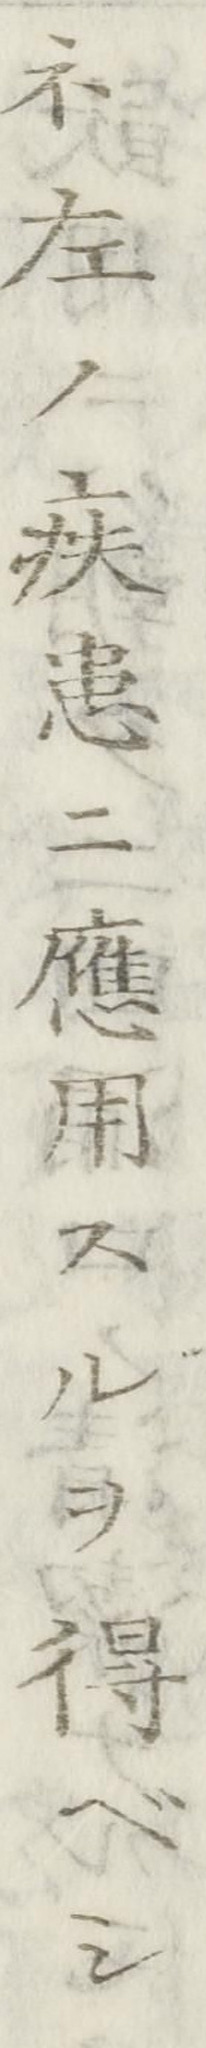ネ左ノ疾患ニ応用スルヲ得ベシ
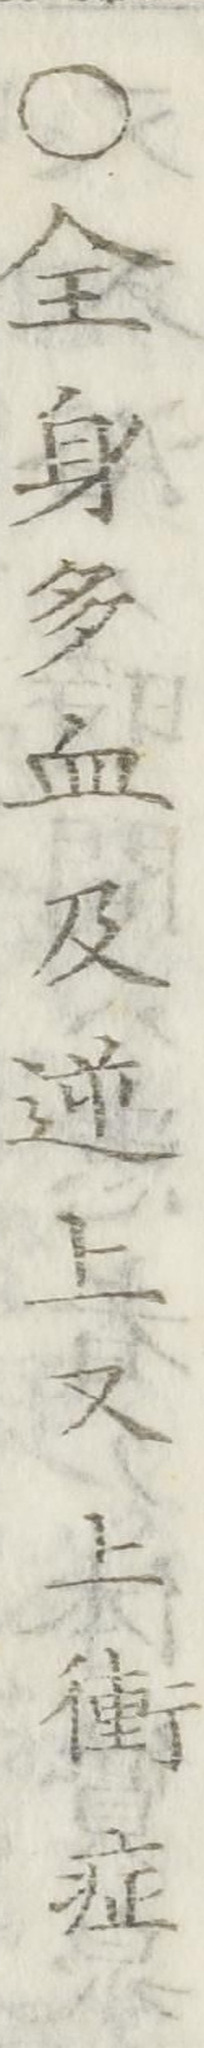〇全身多血及逆上又上衝症
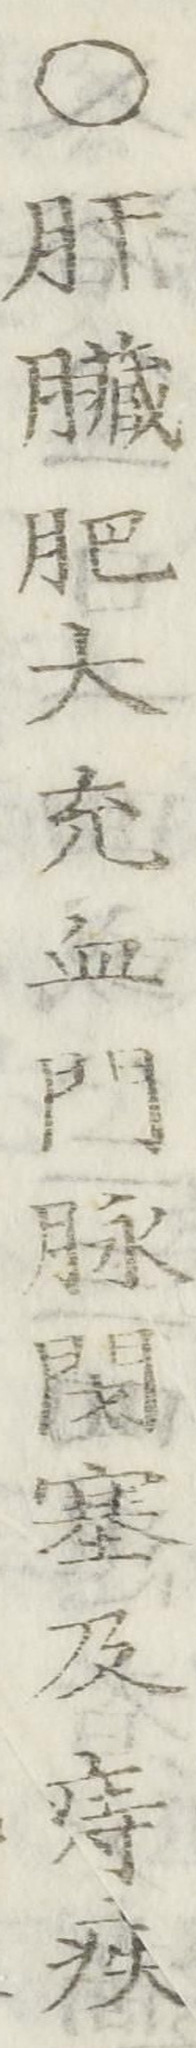〇肝臓肥大充血門脈閉塞及痔疾
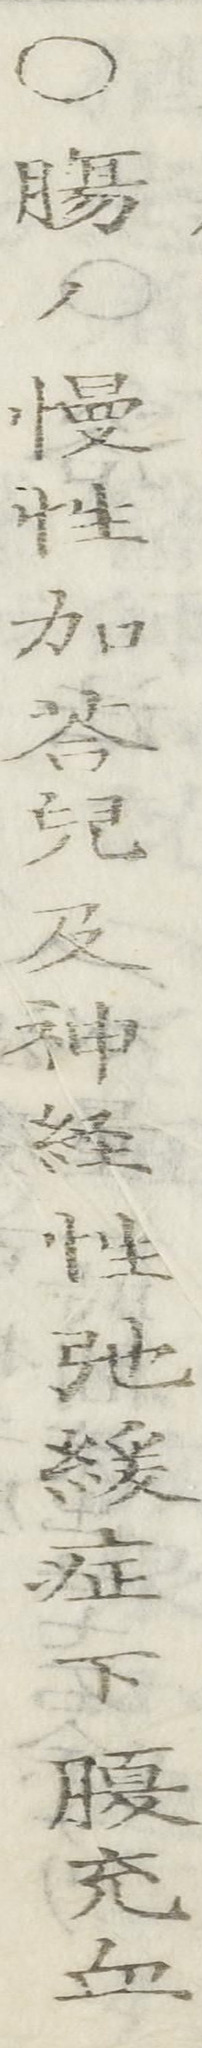〇腸ノ慢性加答児及神経性弛緩症下腹充血
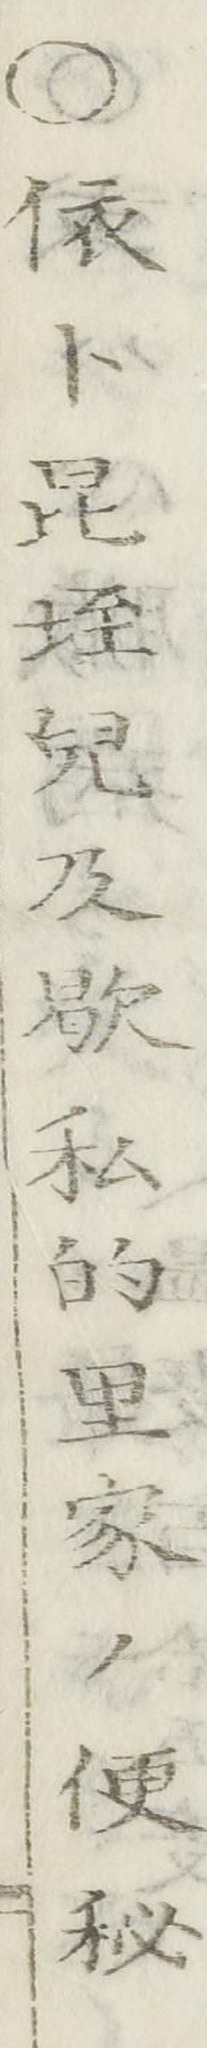〇依卜昆垤児及歇私的里家ノ便秘

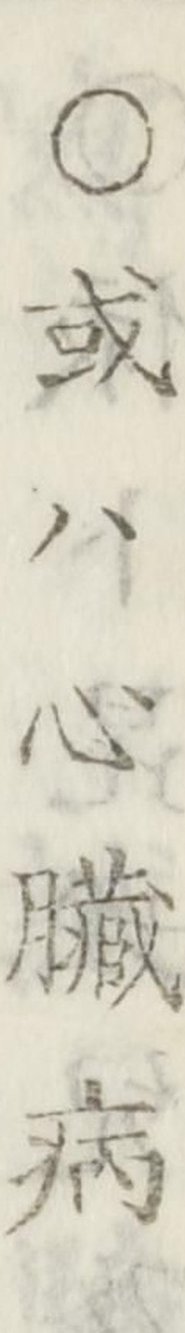〇或ハ心臓病
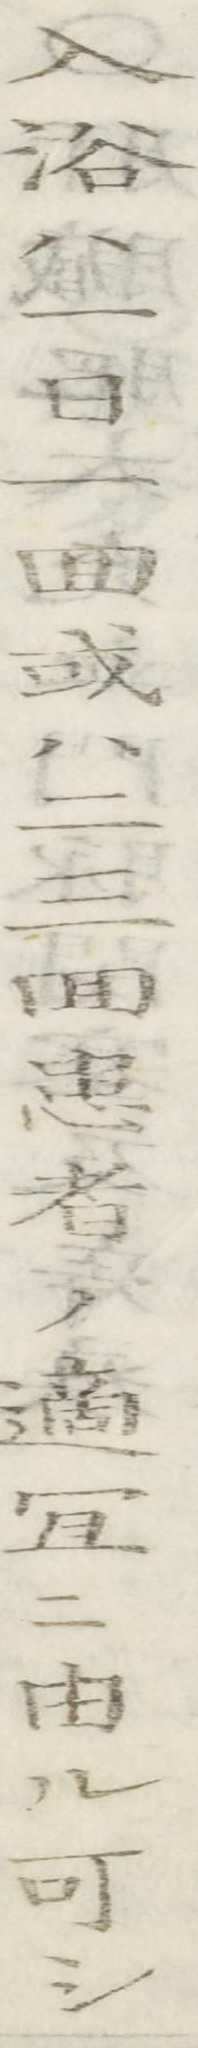入浴ハ一日一回或ハ二三回患者ノ適宜ニ由ル可シ
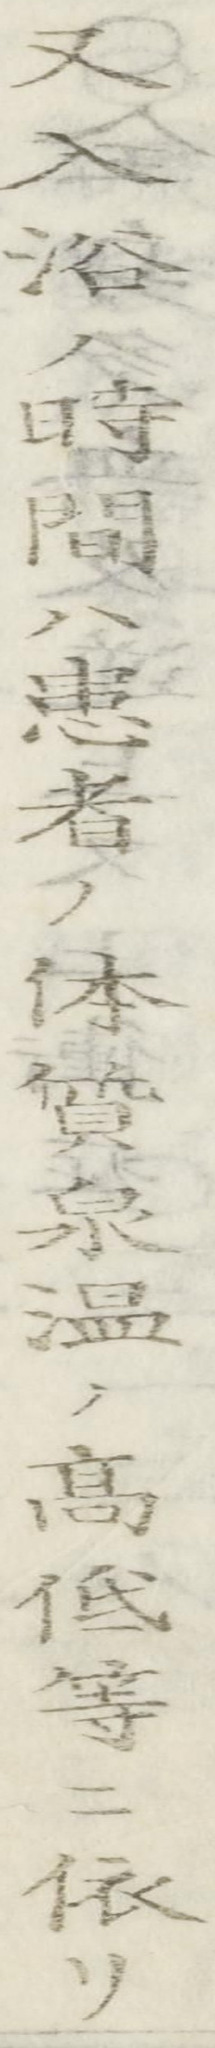又入浴ノ時間ハ患者ノ体質泉温ノ高低等ニ依リ
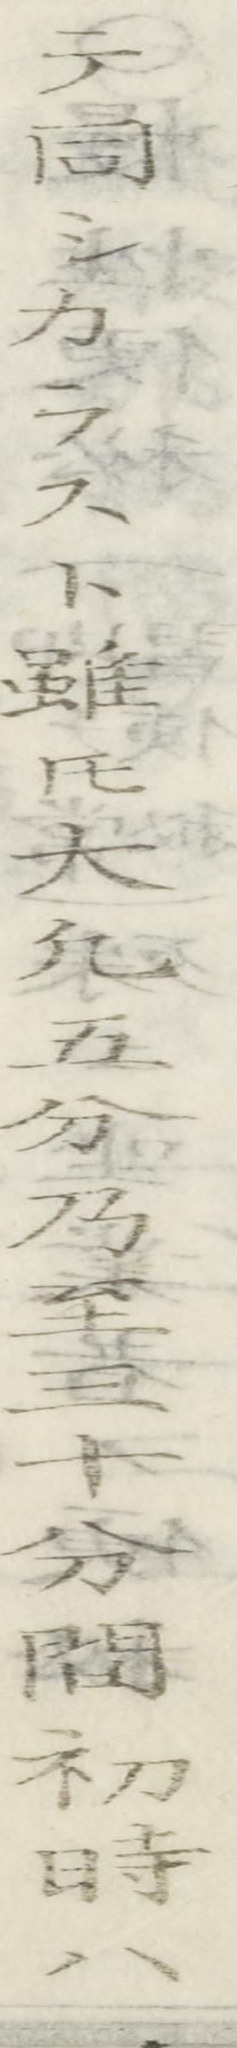ト同シカラスト雖モ大凡五分乃至三十分間初時ハ
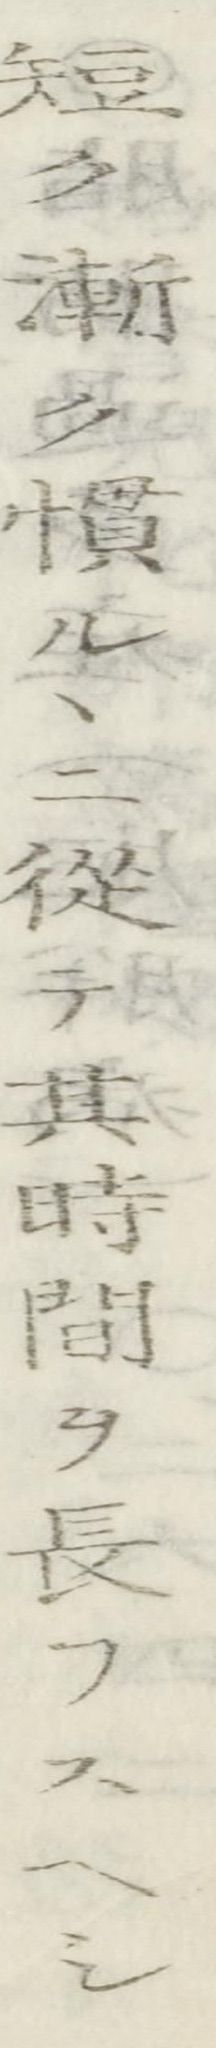短ク漸ク慣ルゝニ従テ其時間ヲ長フスヘシ
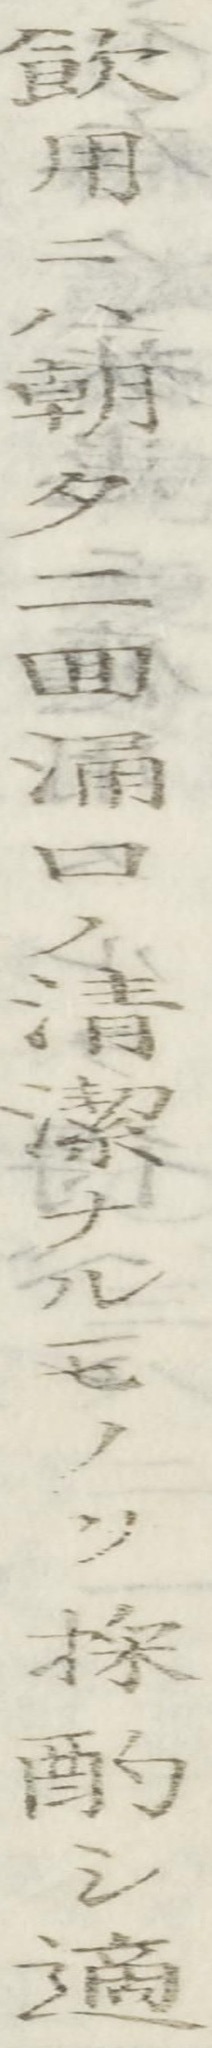飲用ニハ朝夕二回涌口ノ清潔ナルモノヲ採酌シ適
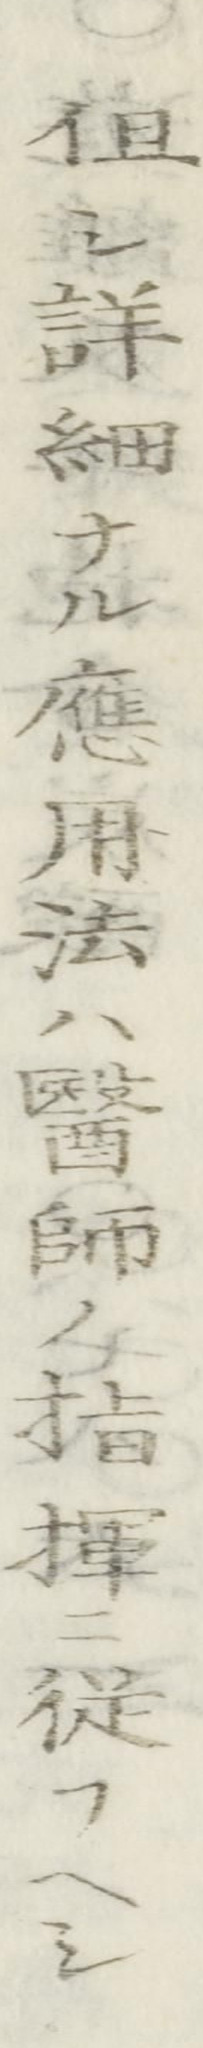但シ詳細ナル応用法ハ医師ノ指揮ニ従フヘシ
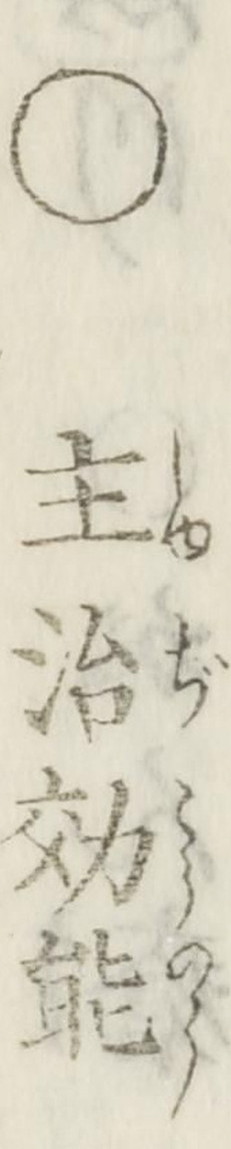〇主治効能
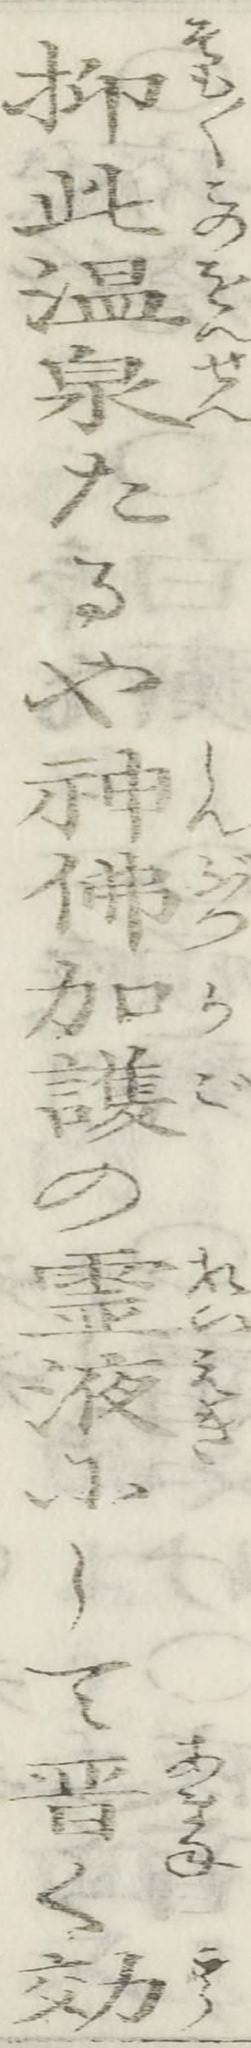抑此温泉たるや神仏加護の霊液にして普く効
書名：鎌先温泉由來記
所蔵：東京大学地震研究所図書室 Earthquake Research Institute Library, The University of Tokyo, JAPAN
